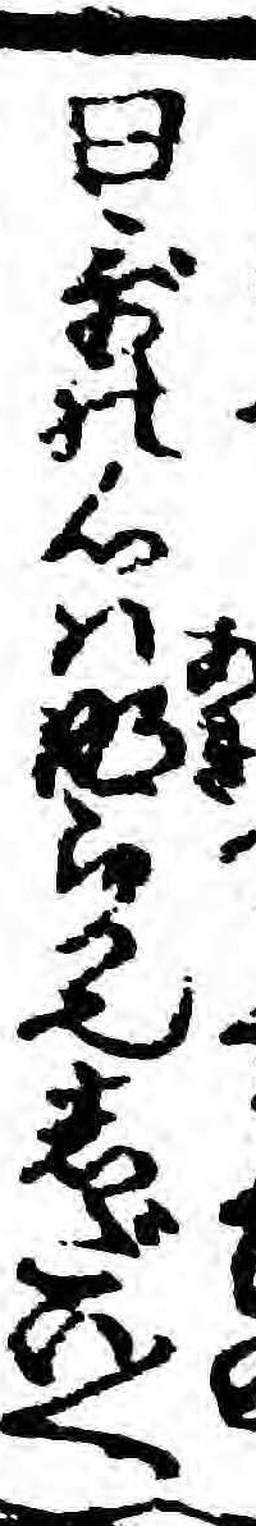曰此哥の心は明らか也しだい〳〵
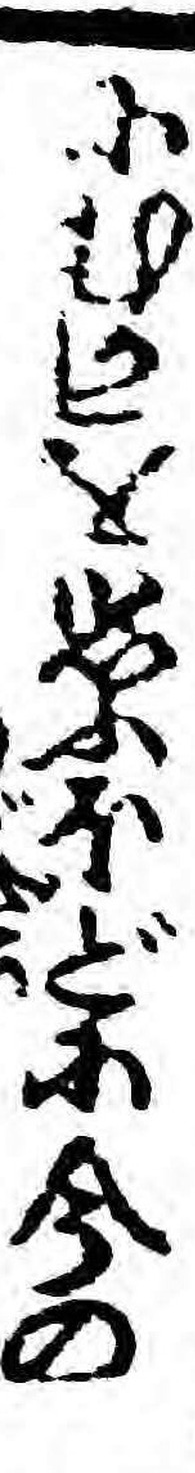にむかしを思ふほどに今の
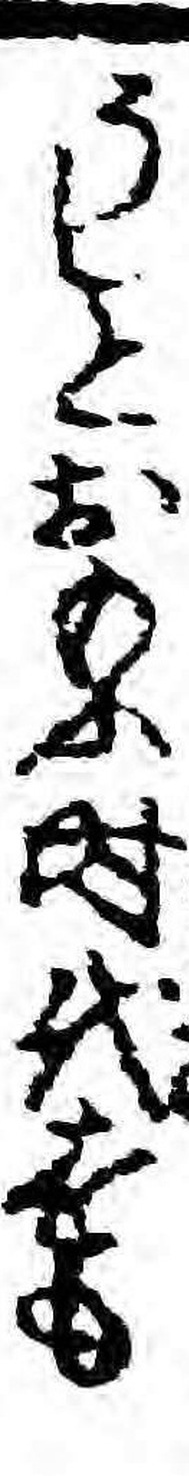うしとおもふ時代をも
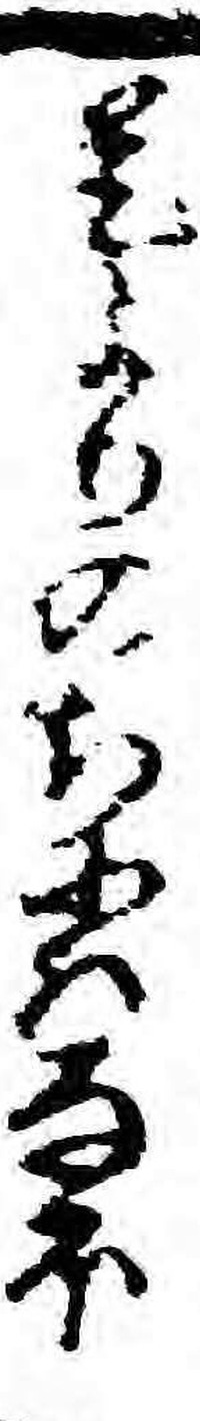是よりのちにはなほ
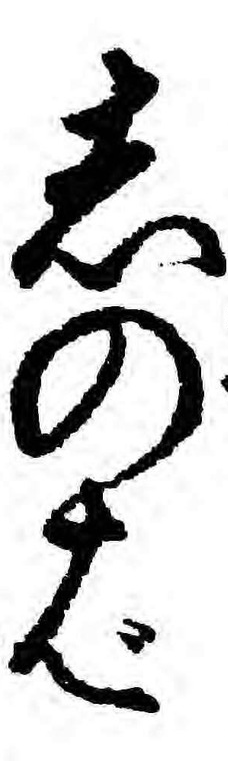しのば
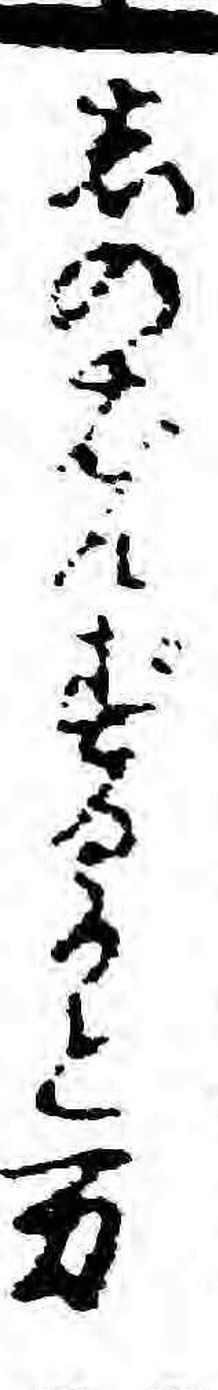しのばんするかと万
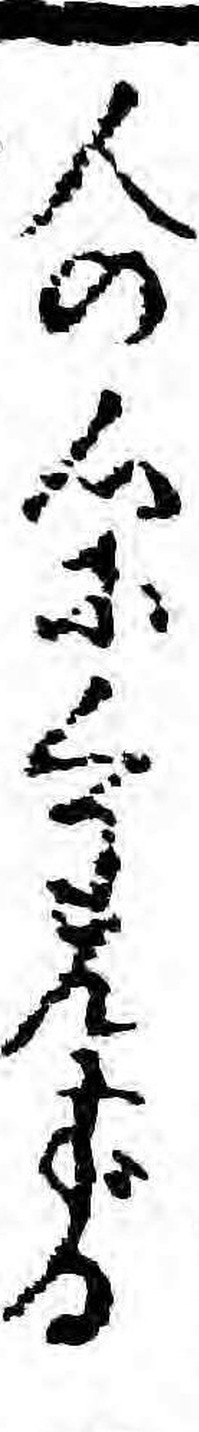人の心にくわんずる
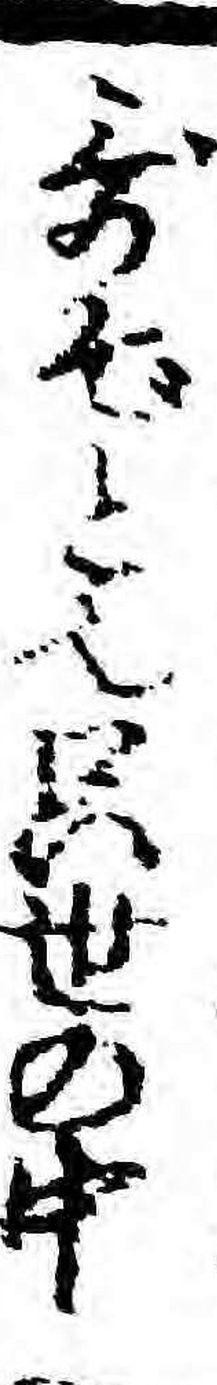哥ぞと也只世の中
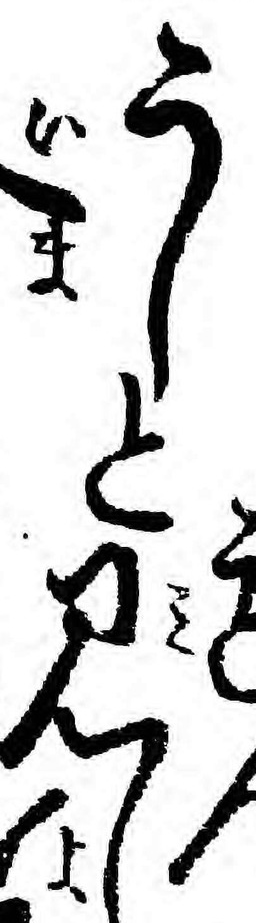うしと見し
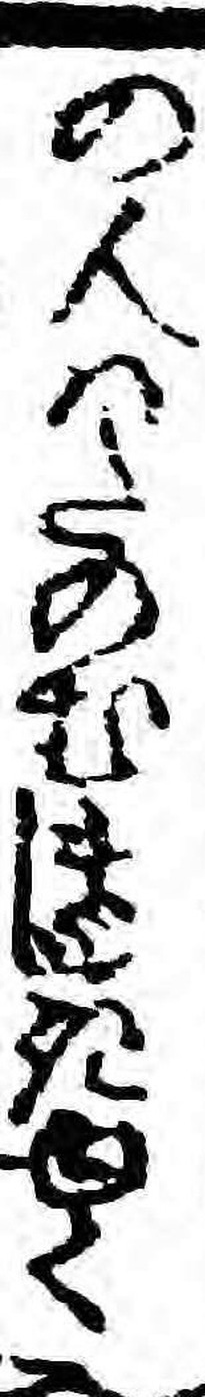の人はたのむまじきゆく
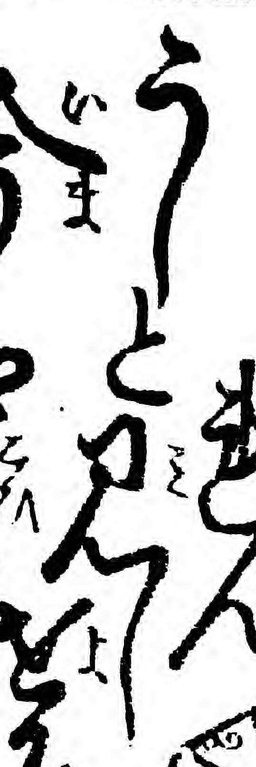うしと見し
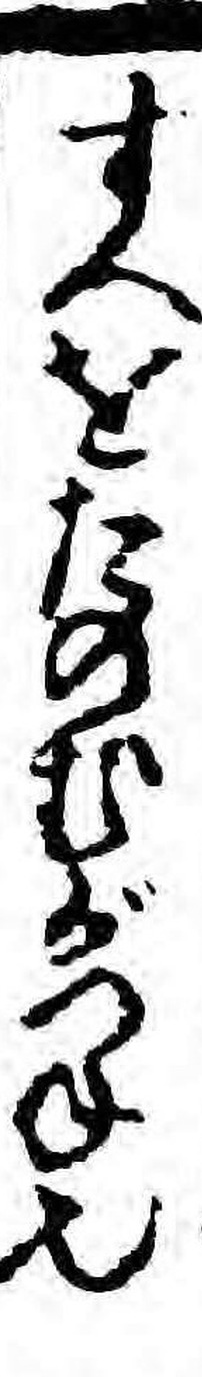すへをたのむかつね也
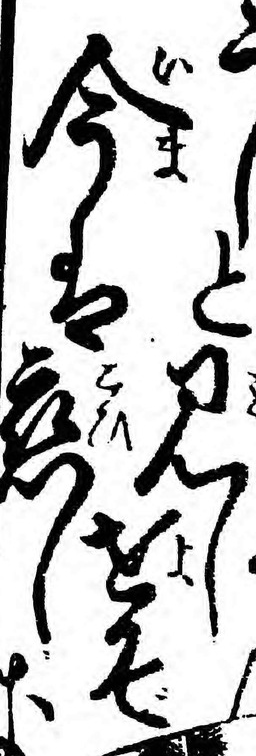今は恋しき
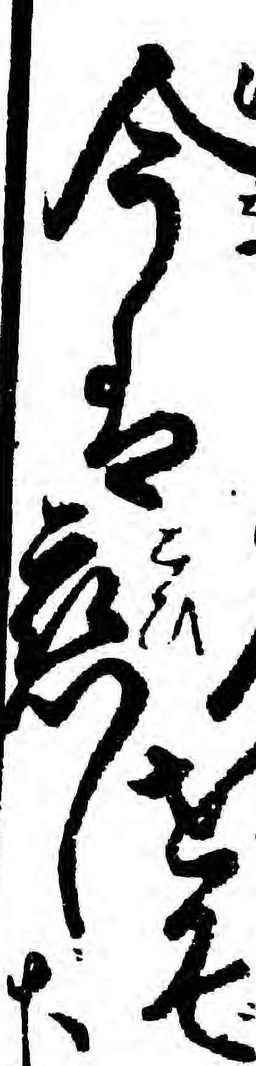今は恋しき
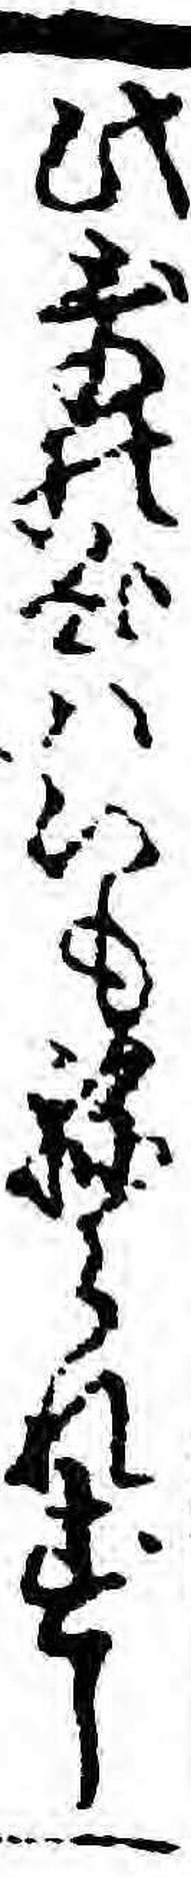此哥の心はいもねられずし
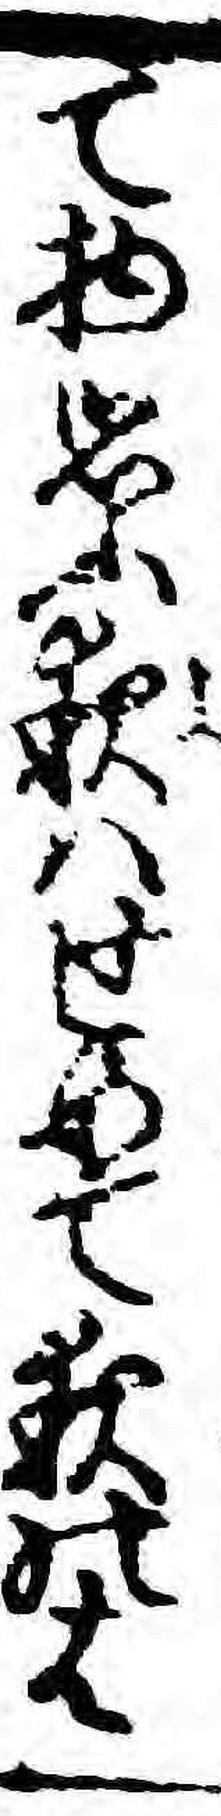て物思ふ夜はせめて夜のは
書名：頭書和歌注譯／壽賀多百人一首小倉錦
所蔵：国文学研究資料館
